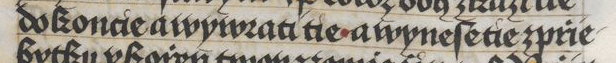dokoncie a wywratí tie.a wyneſe tie zpṙíe¬
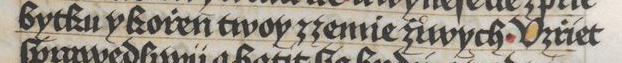bytku y koṙen twoy zżemie żiwych.Vzṙíet
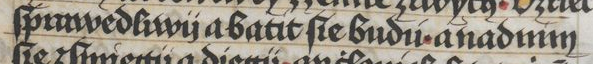ſprawedliwij a batit ſie budú.a nadnim
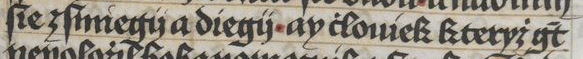ſie zſmiegij a diegij.ay ċlouíek kteryż ḡt
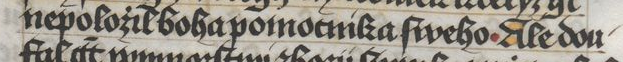nepolożil boha pomocníka ſweho.Ale dou¬
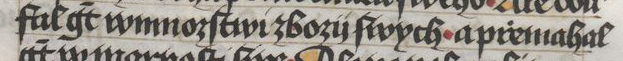fal ḡt wmnozſtwí zbozij ſwych.a pṙemahal
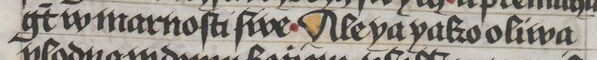ḡt w marnoſti ſwe.Ale ya yako oliwa
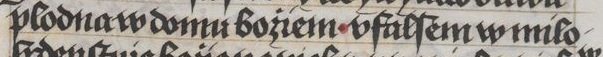plodna w domu bożíem.vſalſem w milo¬
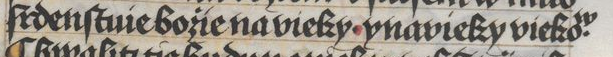ſrdenſtuie bożíe na vieky.ynavieky viekow.
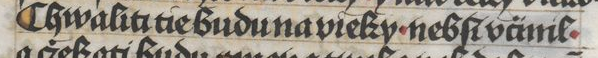Chwaliti tie budu na vieky.nebſi vċinil.
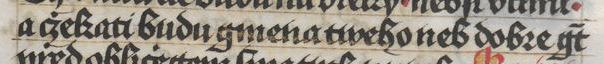a cżekati budu gmena tweho neb dobre ḡt
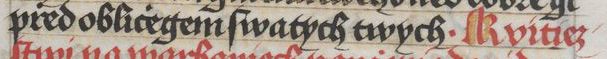pṙed obliċegem ſwatych twych.Kvitiez¬
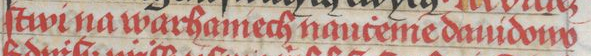ſtwí na warhaniech nauċeníe dauidowo
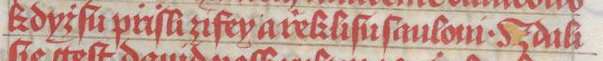kdyż ſu pṙiẛli ziſey a ṙekliſu ſaulouí.Zdali
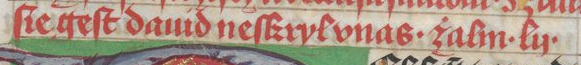ſie geſt dauid neſkryl vnas.żalm.lij.
